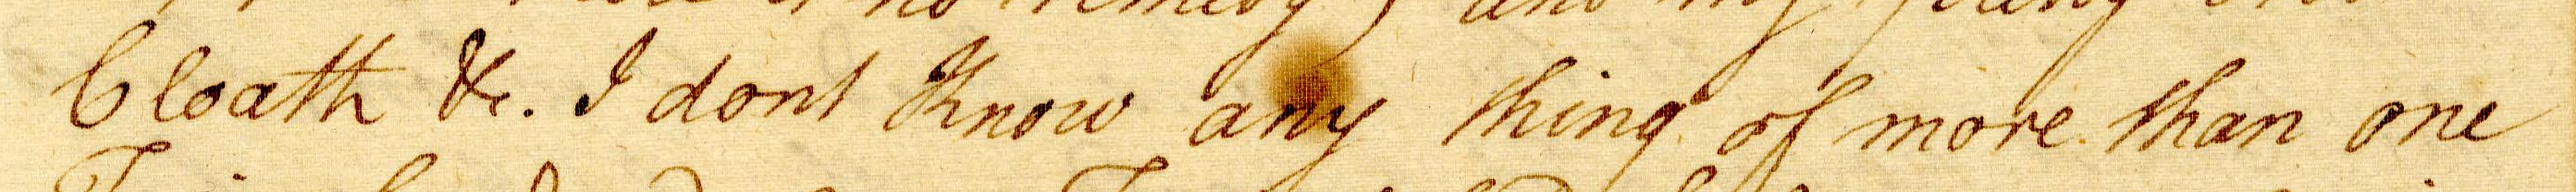Cloath &c. I dont know any thing of more than one
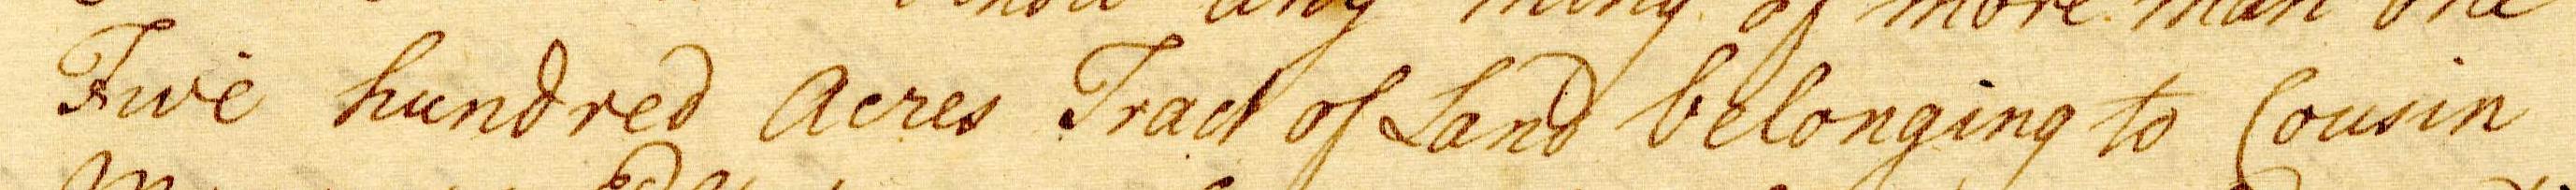Five hundred Acres Tract of Land belonging to Cousin
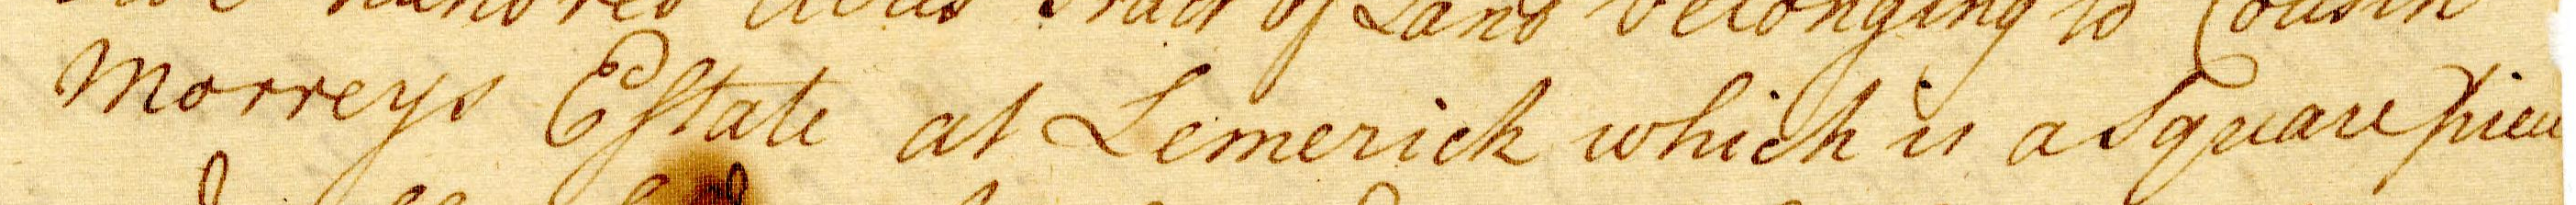Morreys Estate at Lemerick which is a square piece
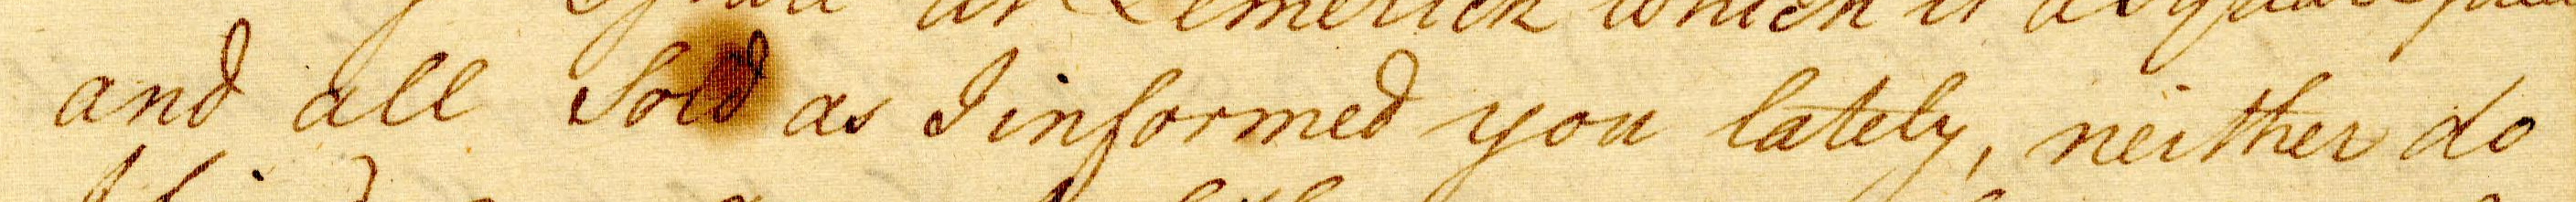and all Sold as I informed you lately, neither do
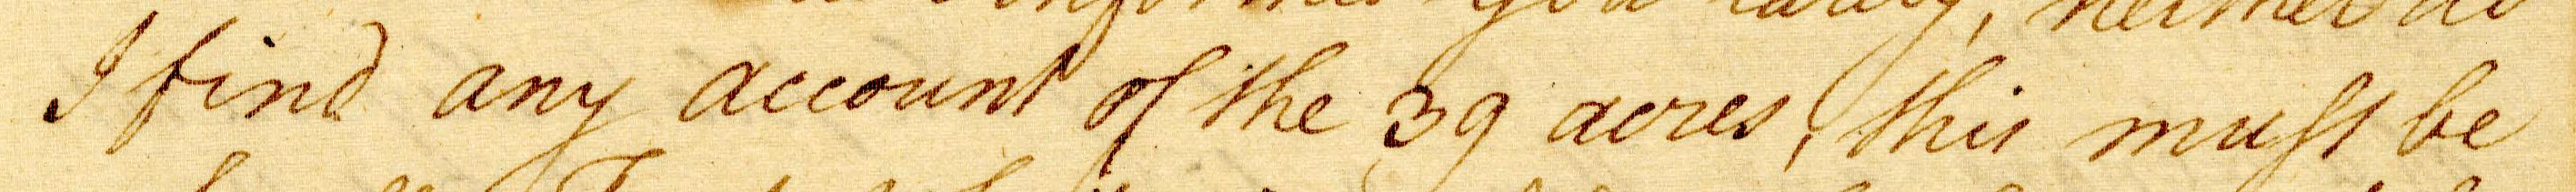I find any account of the 39 acres, this must be
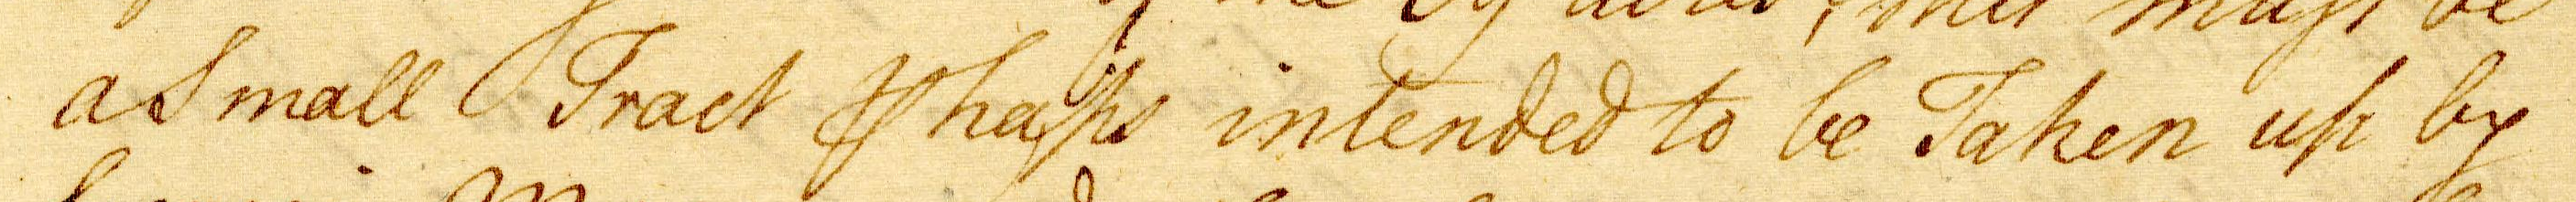a Small Tract perhaps intended to be Taken up by
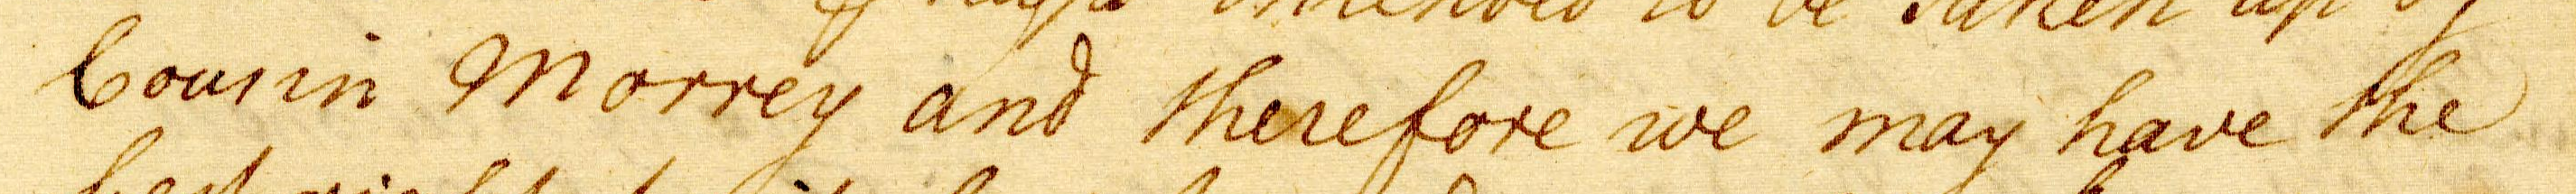Cousin Morrey and therefore we may have the
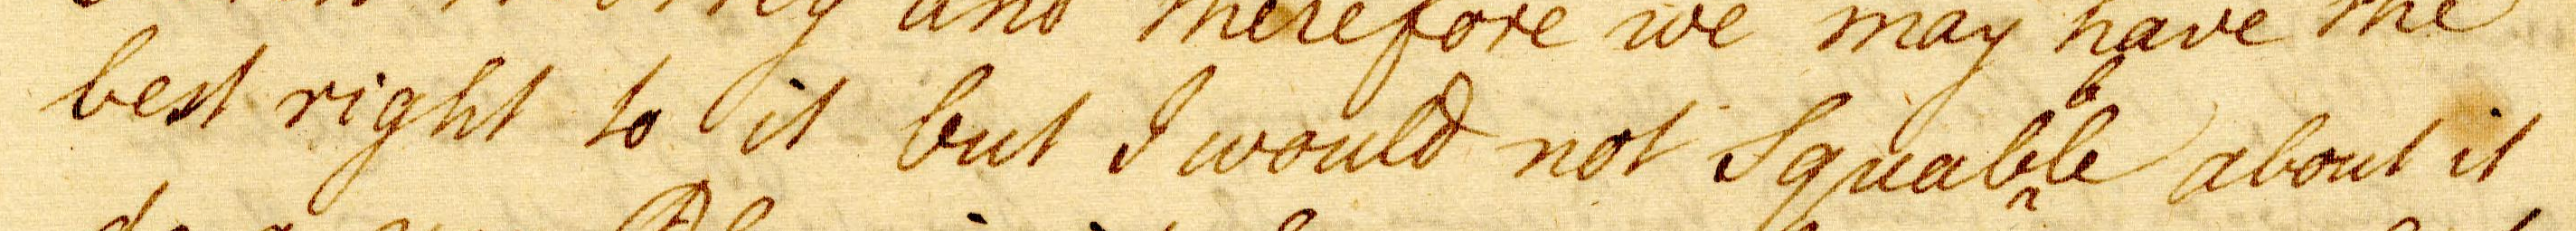best right to it but I would not Squab^ble about it
